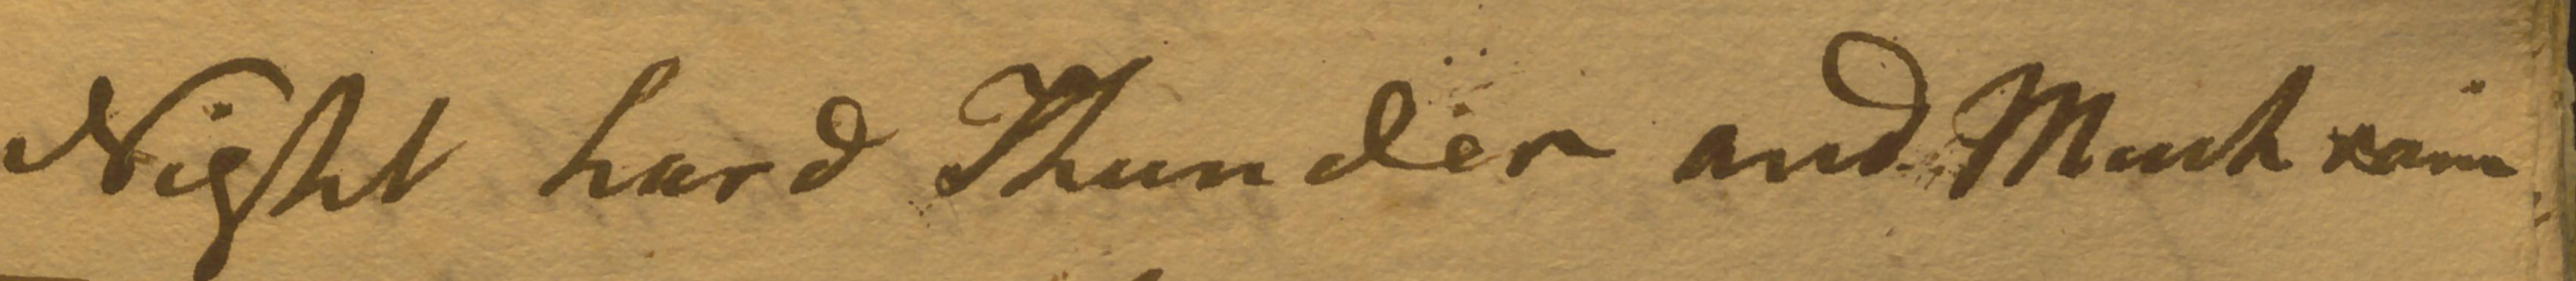Night hard Thunder and Much ram
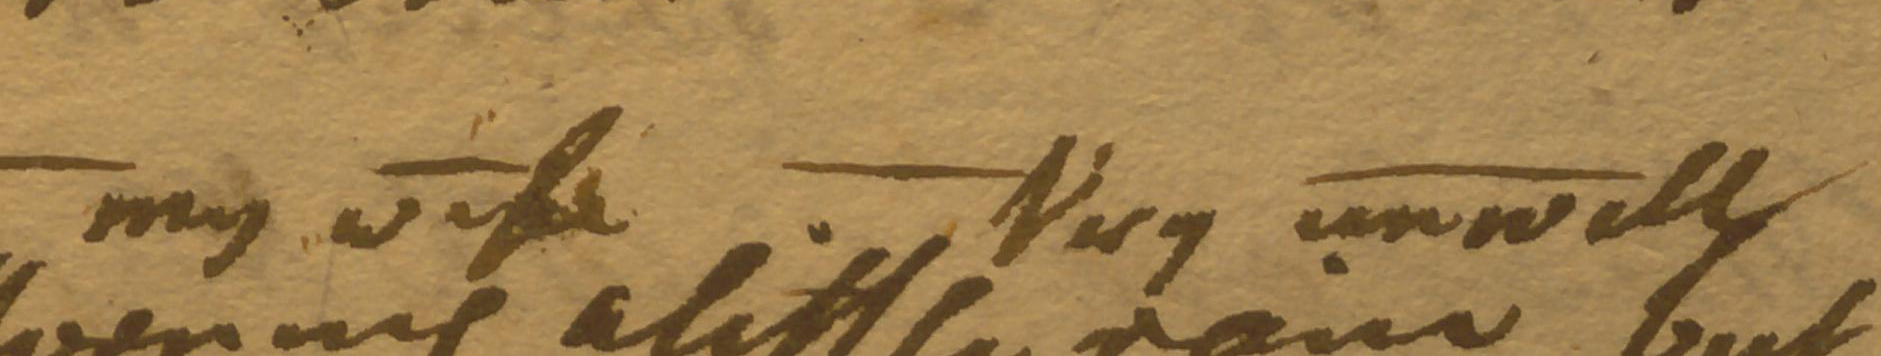my wife. Very unwell
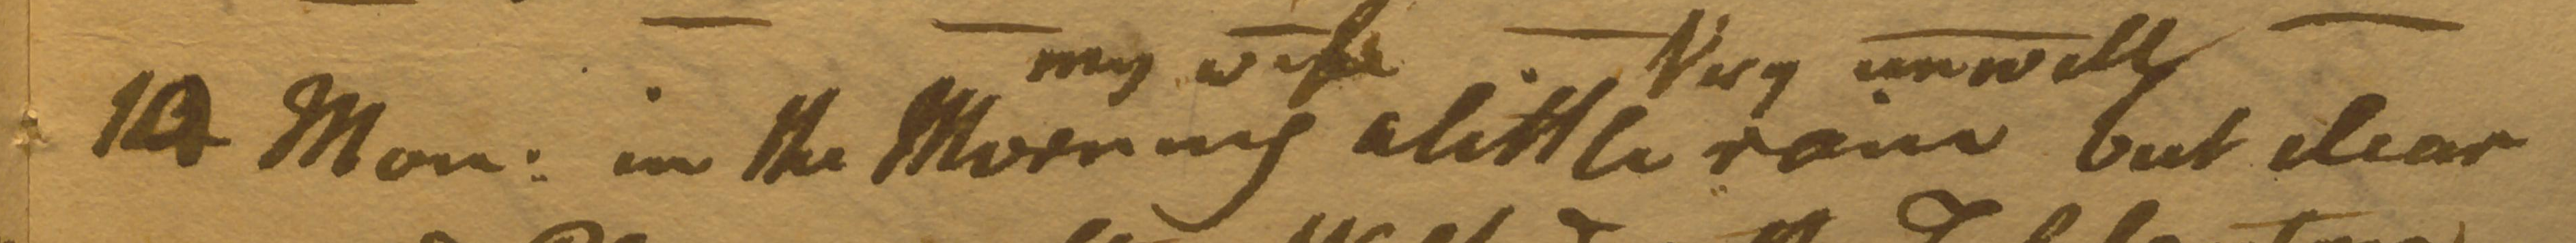14 Mon; in the Morning a little rain but clear
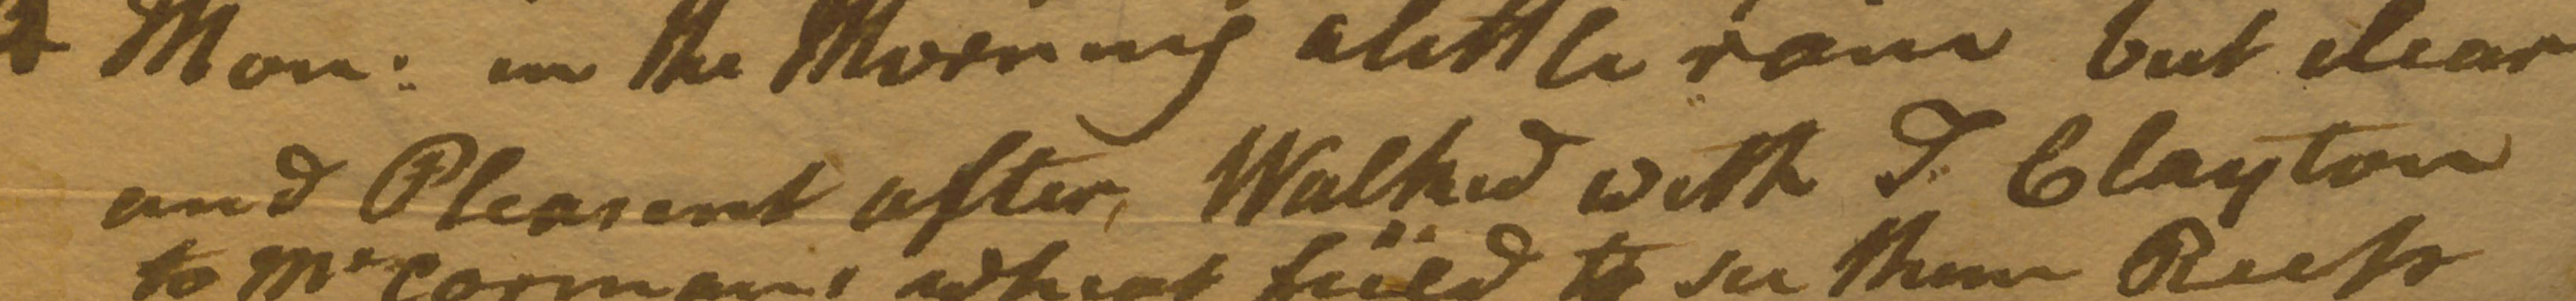and Pleasent after, Walked with T. Clayton
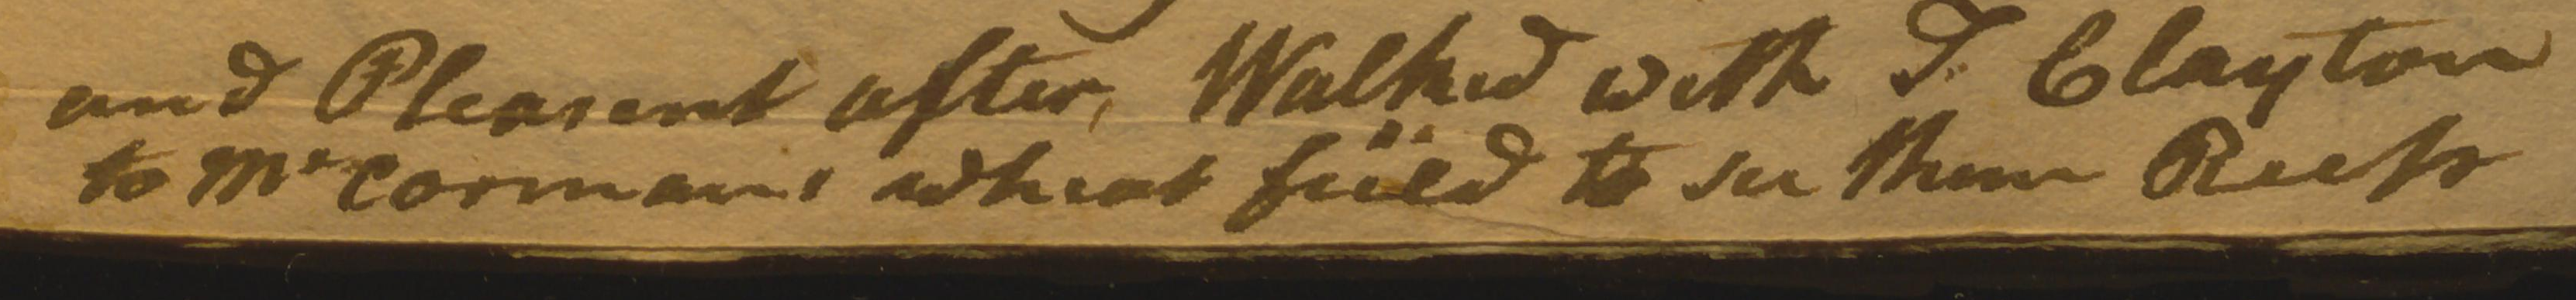to M^cCormans wheat field to see them Reep
